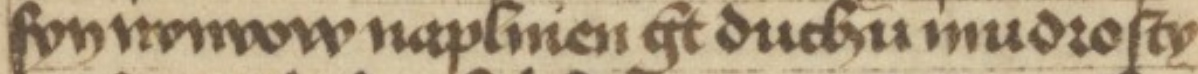ſyn nvnvow naplnien g̑t duchu mudroſty
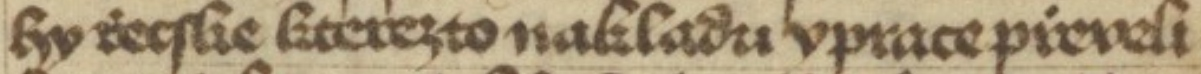hy ṙecſke kterezto nakladu yprace pṙeveli-
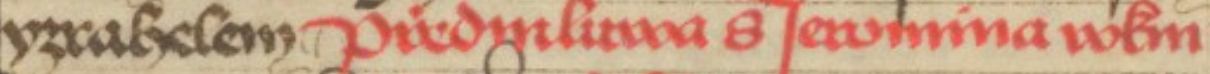yzrahelem Pṙedmluwa s Jeromina wkni
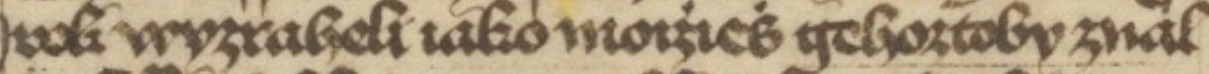voli wyzraheli iako moiżieṡ gehoztoby znal
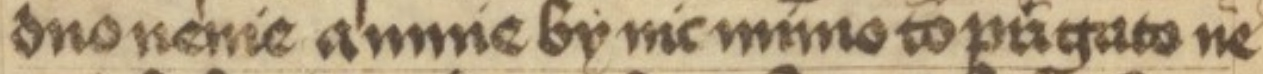dno nenie a mnie by nic mimo to pṙigato ne-
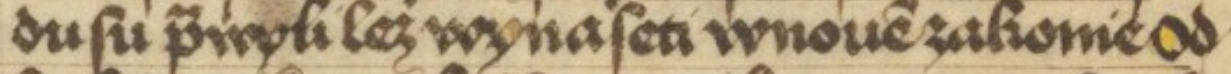du ſu p̃wyli leż wynaẛeti wnouȇ zakonie Od-
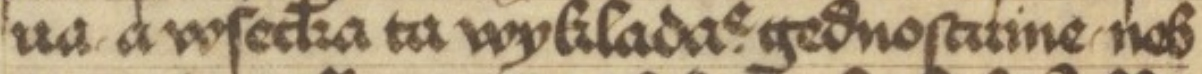ua a wẛecka ta wyklada.e gednoſtaine neb
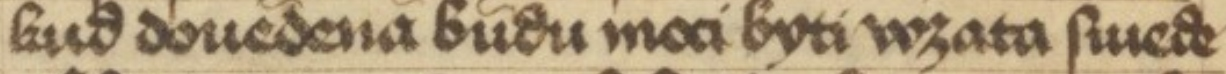kud douedena budu moci byti wzata ſuiede-
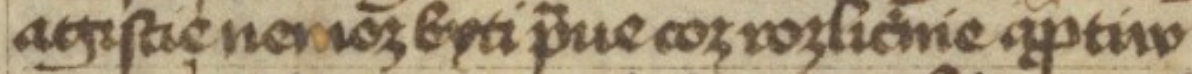agiſtie nemoz byti p̄ue coz rozliċnie aꝓtiw
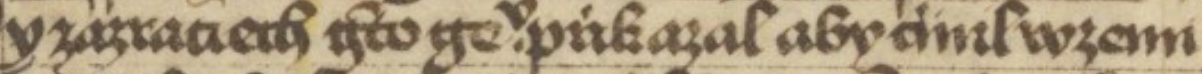y zazraciech g̑to ge.v pṙikazal aby ċinil wzemi
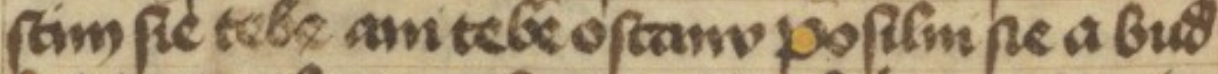ſtim ſie tebe ani tebe oſtanv Poſilni ſie a bud
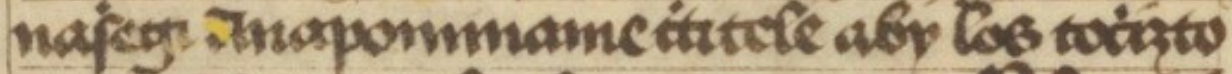naẛegi Anapominame ċtitele aby los toċizto
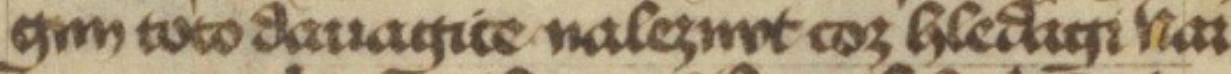gim toto dauagice naleznvt coz hledagi Nai-
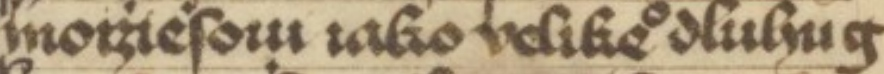moiżieẛoui iako velike° dluhu g
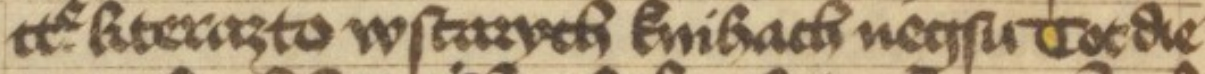ct.e kterazto wſtarych knihach negſu Tot die-
